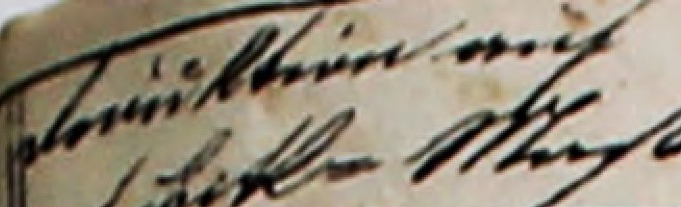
Reduktion auf
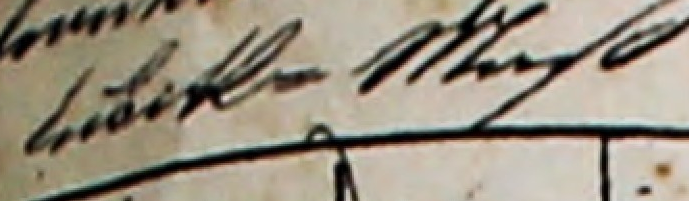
Cubik= Maß
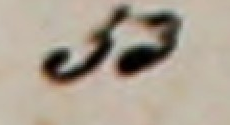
53
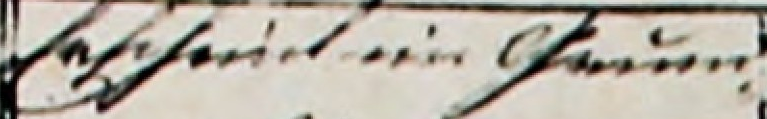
Erscheint im Grund„
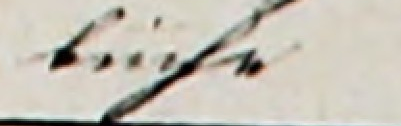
buche
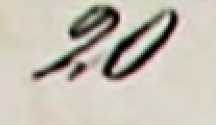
20
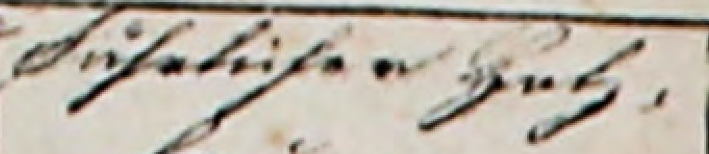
Jährlicher Holz„
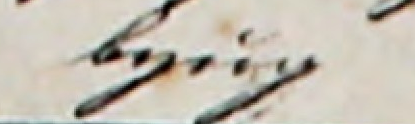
bezug
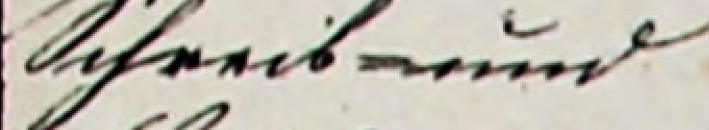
Schreib = und
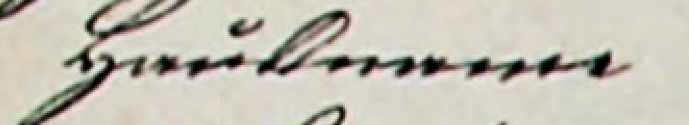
Hausmann
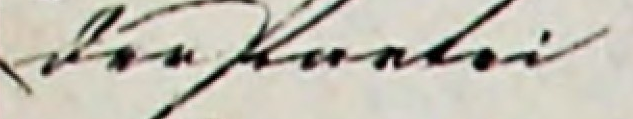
der Partei
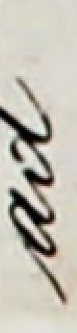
ad
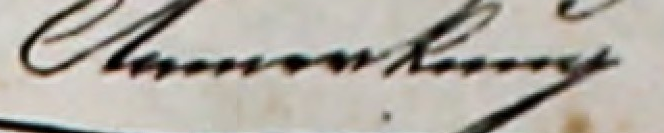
Anmerkung
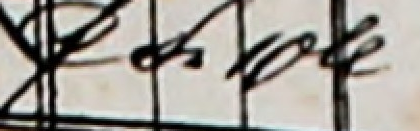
???
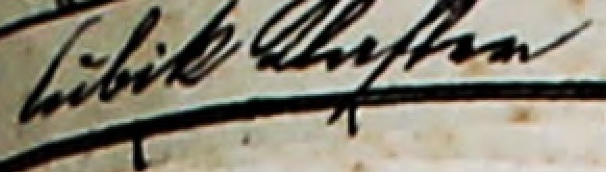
Cubik Klafter
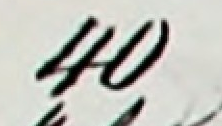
40
